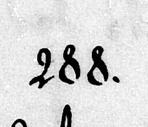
30.
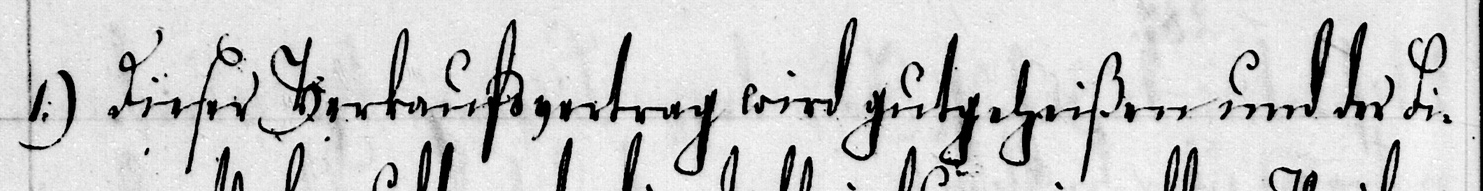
1.) Dieser Verkaufsvertrag wird gutgeheißen und der Fi¬
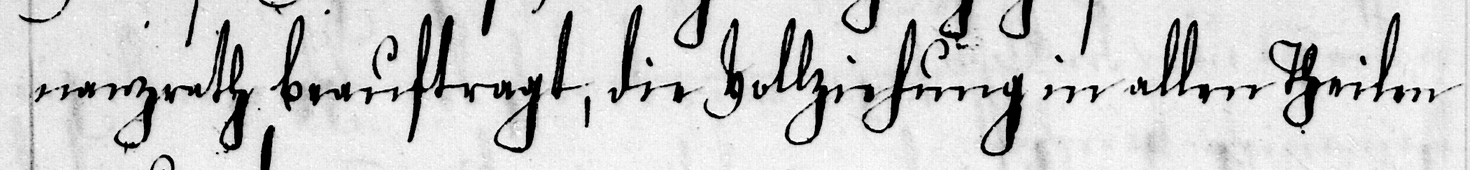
nanzrath beauftragt, die Vollziehung in allen Theilen
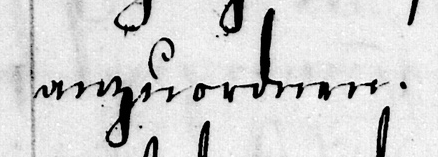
anzuordnen.
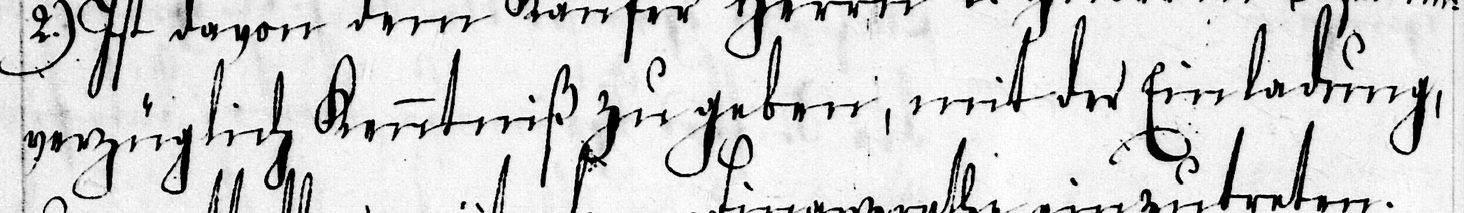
verzüglich Kenntniß zu geben, mit der Einladung,
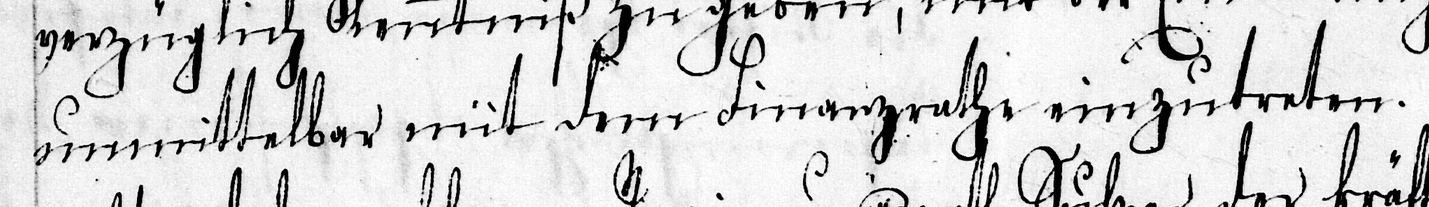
unmittelbar mit dem Finanzrathe einzutreten.
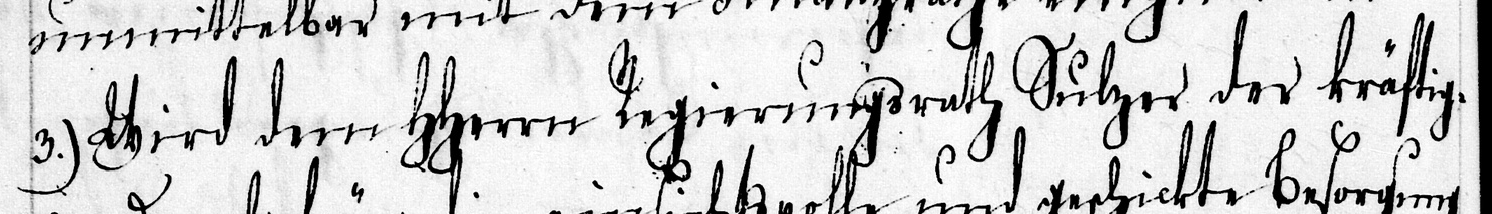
3.) Wird dem HHerrn Regierungsrath Sulzer der kräftig¬
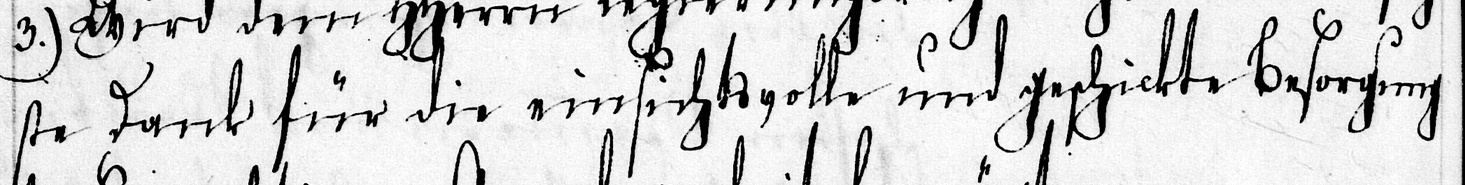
ste Dank für die einsichtsvolle und geschickte Besorgung
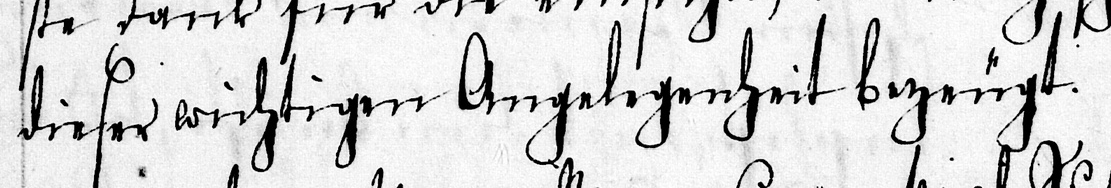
dieser wichtigen Angelegenheit bezeugt.
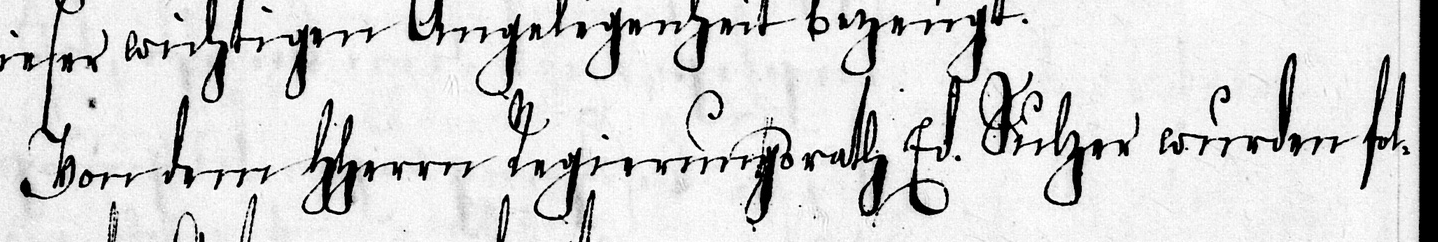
Von dem HHerrn Regierungsrath Ed. Sulzer wurden fol¬
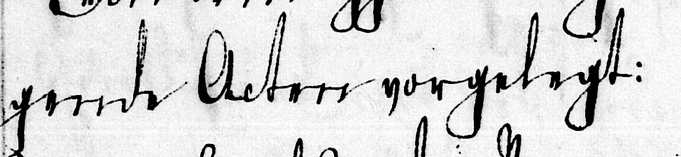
gende Acten vorgelegt:
